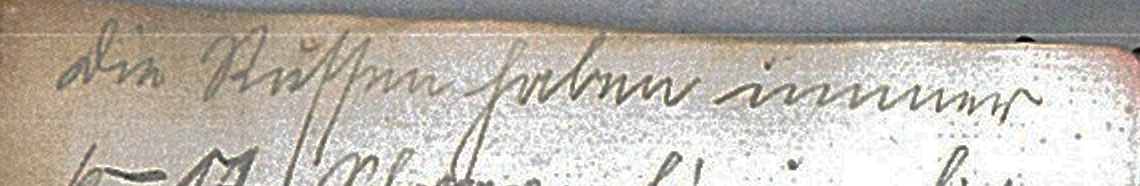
Die Russen haben immer
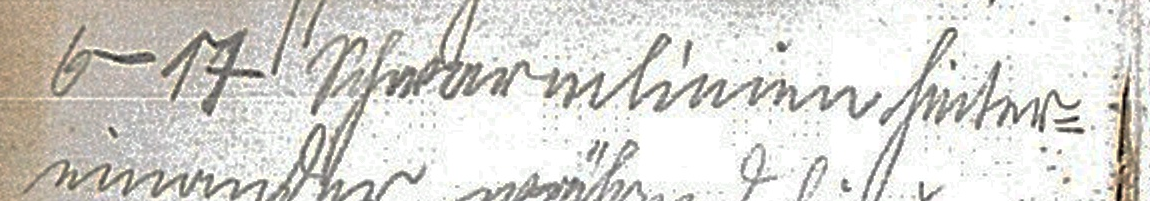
6-7 Schwarmlinien hinter-
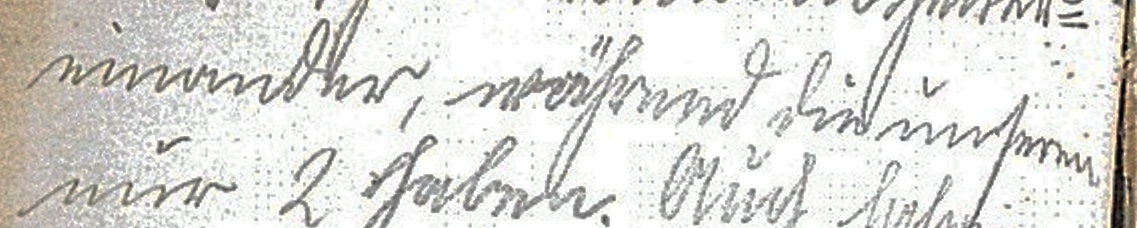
einander, während die unseren
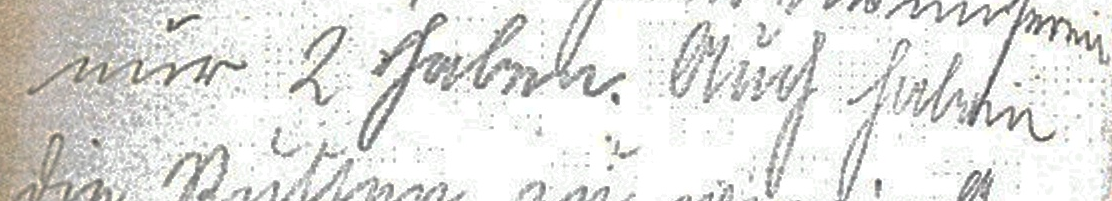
nur 2 haben. Auch haben
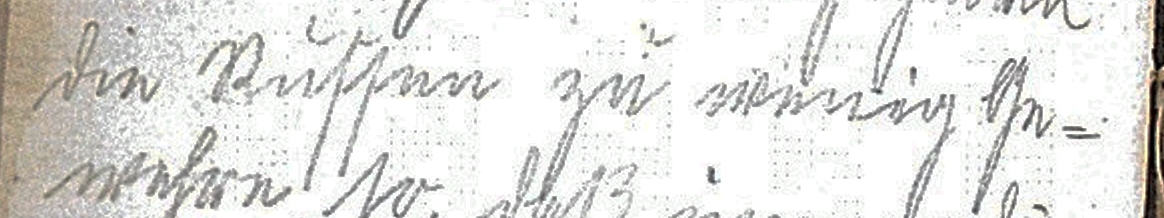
die Russen zu wenig Ge-
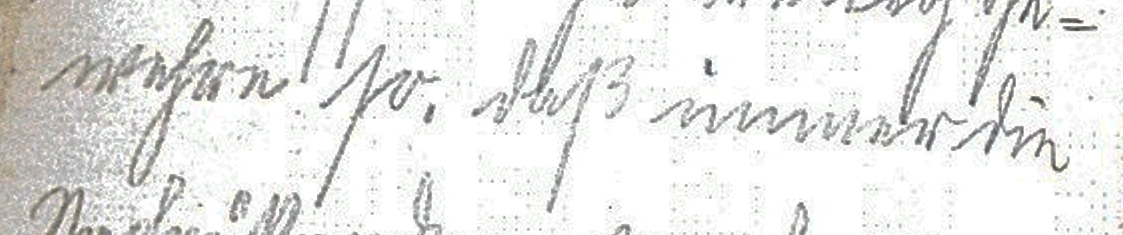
wehre, so daß immer die
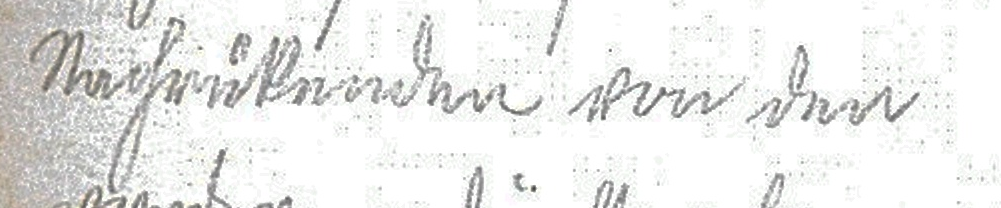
Nachrückenden von den
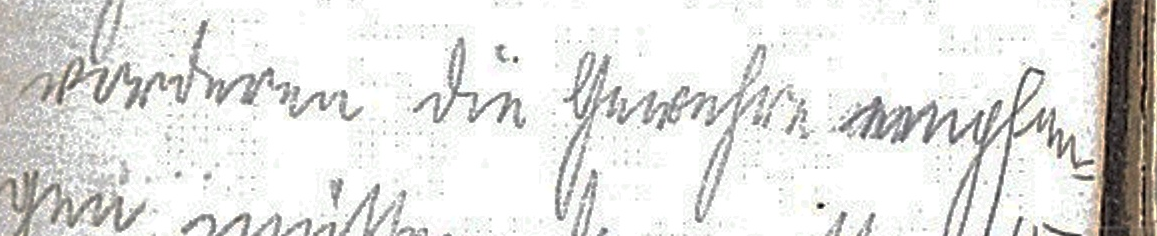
vorderen die Gewehre auffan-
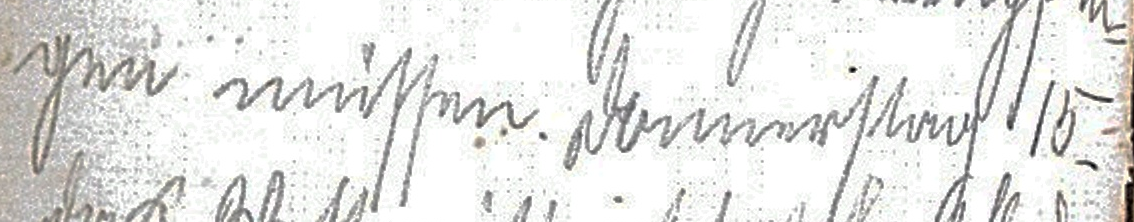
gen müssen. Donnerstag 15.
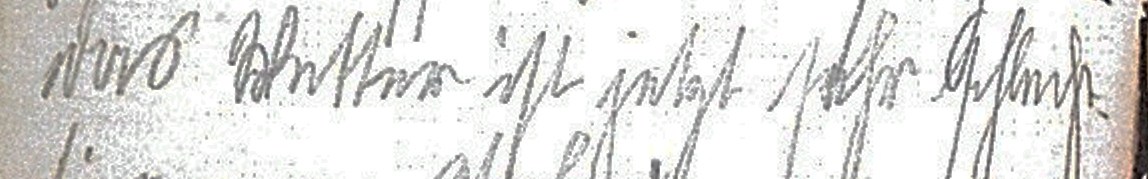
Das Wetter ist jetzt sehr schlecht.
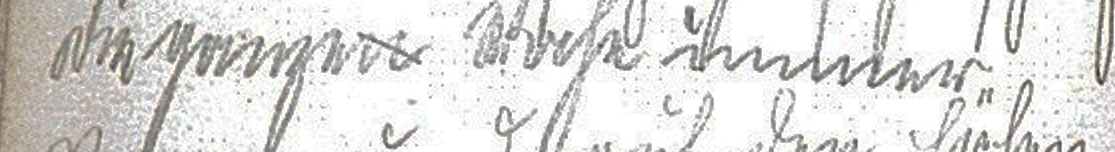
Die ganze Woche immer
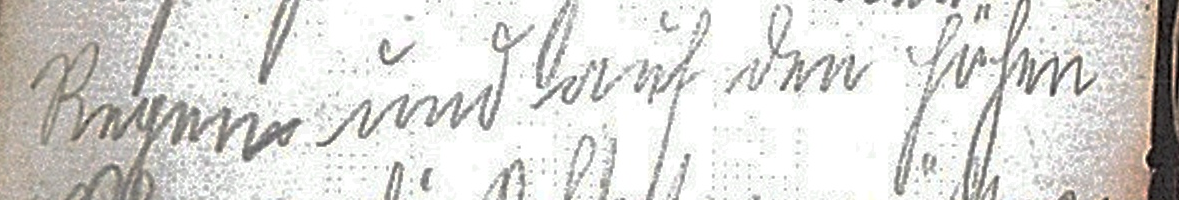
Regen und auf den Höhen
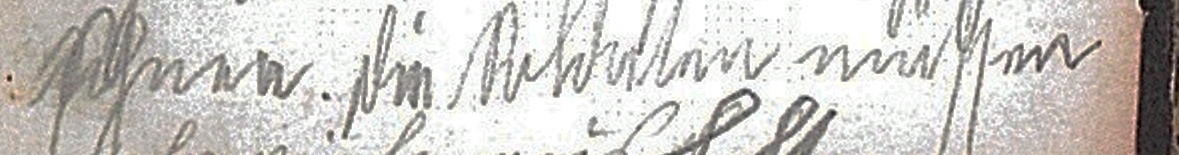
Schnee. Die Soldaten müssen
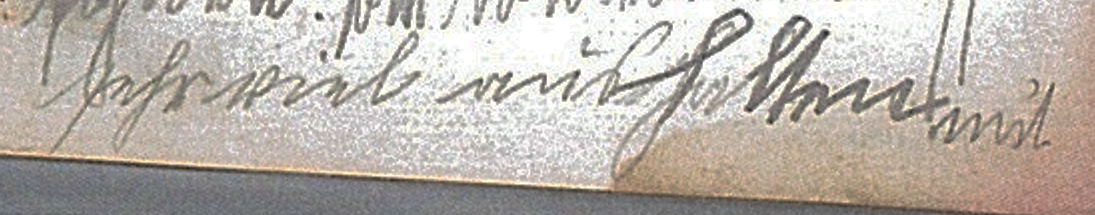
sehr viel aushalten mit
